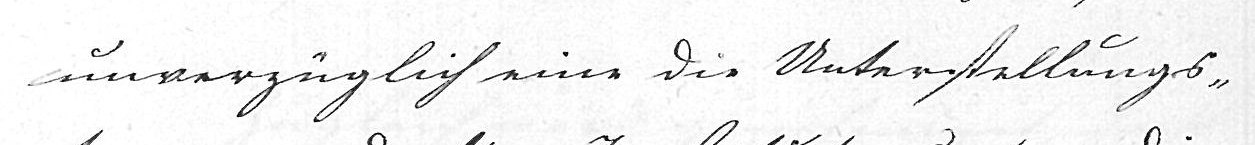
unverzüglich eine die Unterstellungs-
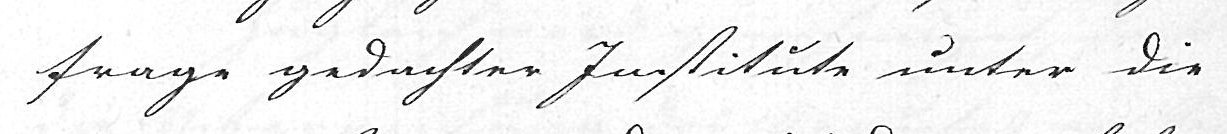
frage gedachter Institute unter die
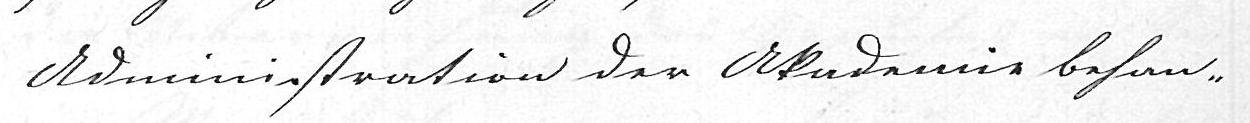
Admistration der Akademie behan-
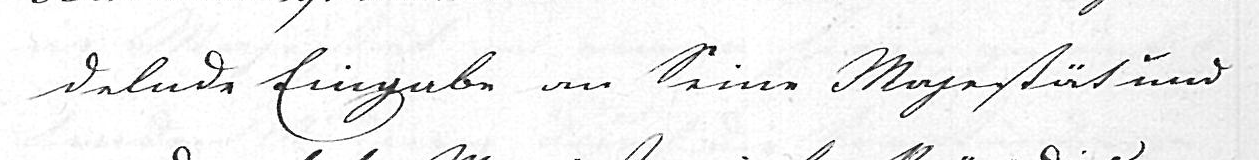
delnde Eingabe an Seine Majestät und
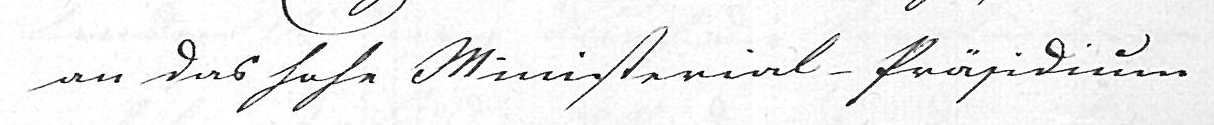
an das hohe Ministerial-Präsidium
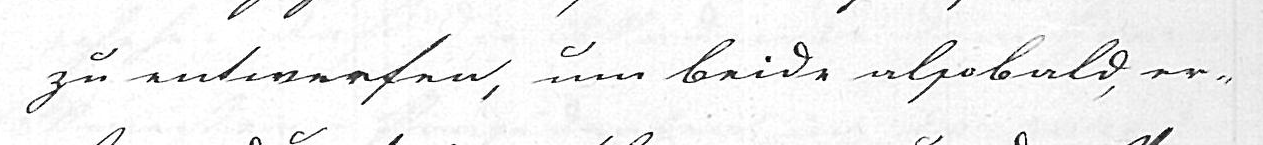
zu entwerfen, um beide alsobald, er-
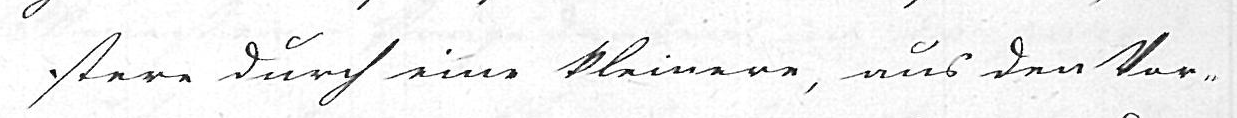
stere durch eine kleinere, aus den Vor-
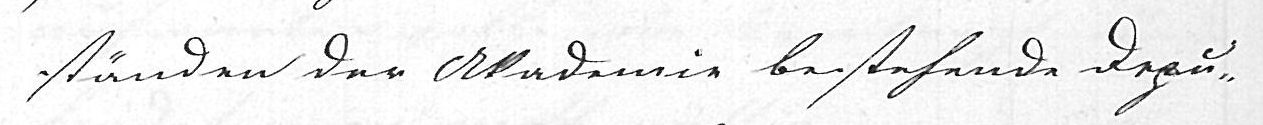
ständen der Akademie bestehenden Depu-
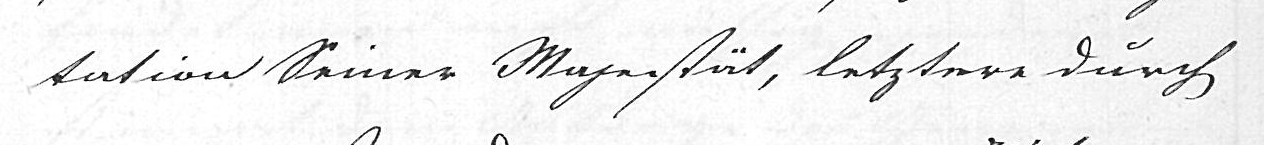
tation Seiner Majestät, letztere durch
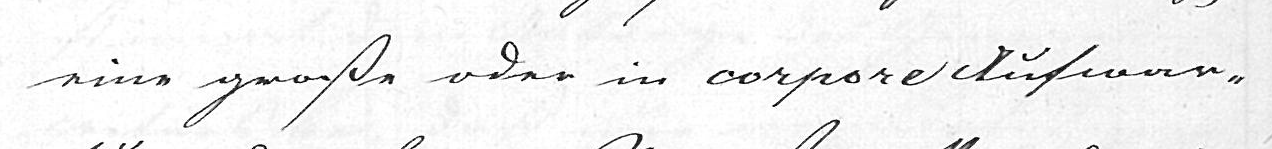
eine große oder in corpore Aufwar-
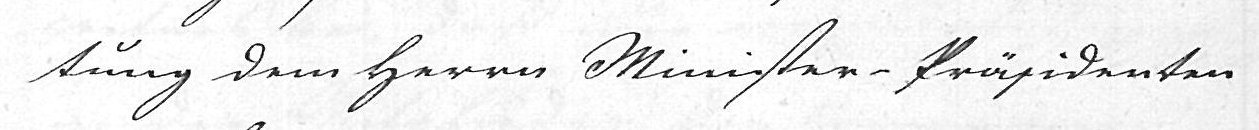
tung dem Herrn Minister-Präsidenten
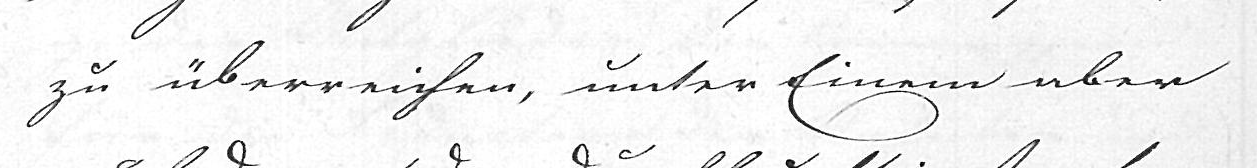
zu überreichen, unter Einem aber
